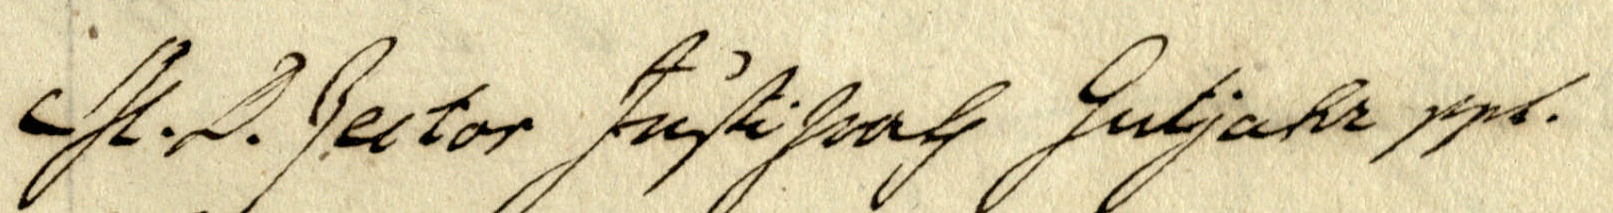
M. D. Rector Justizrath Gutjahr ppt.
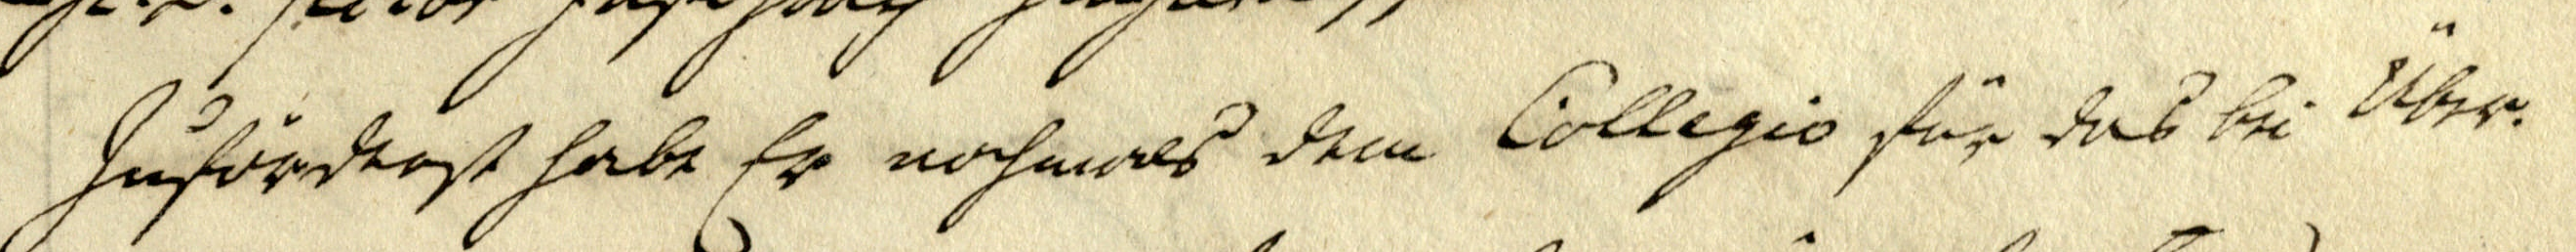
Zuförderst habe Er nochmals dem Collegio für das bei Über¬
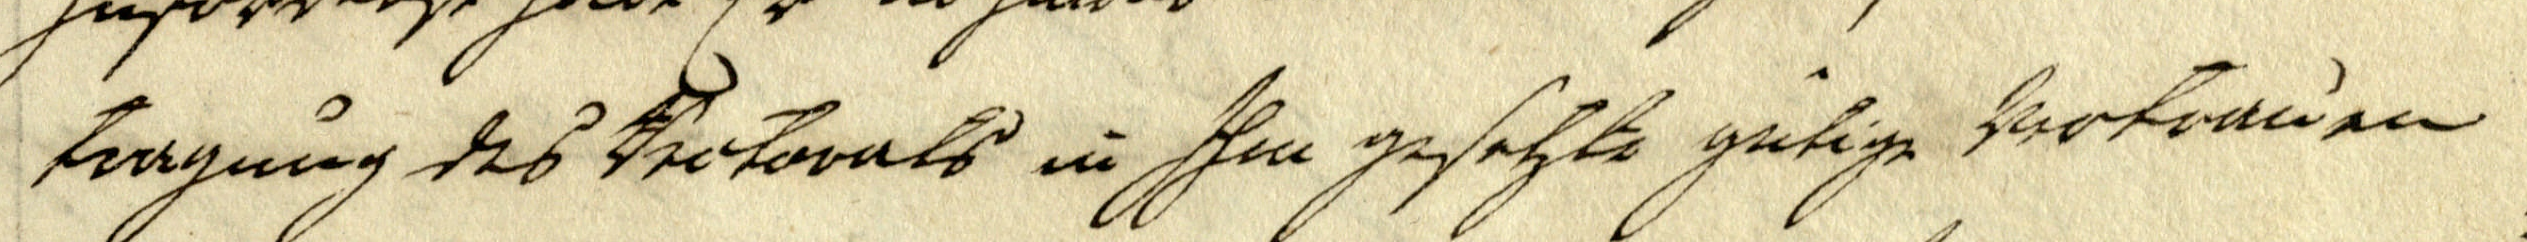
tragung des Rectorats in Ihm gesetzte gütige Vertrauen
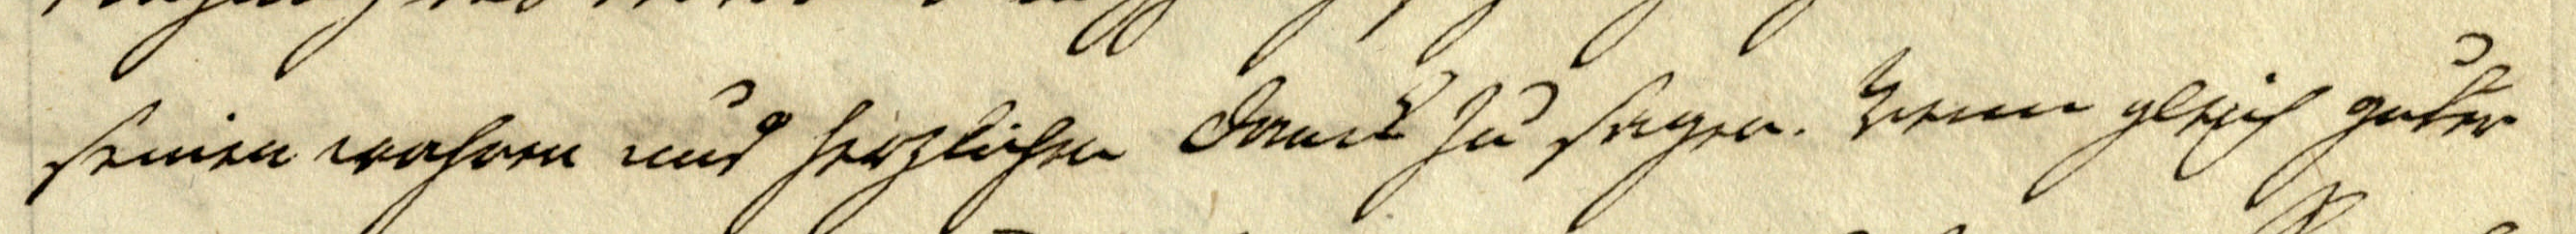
seinen wahren und herzlichen Danck zu sagen. Wenn gleich guter
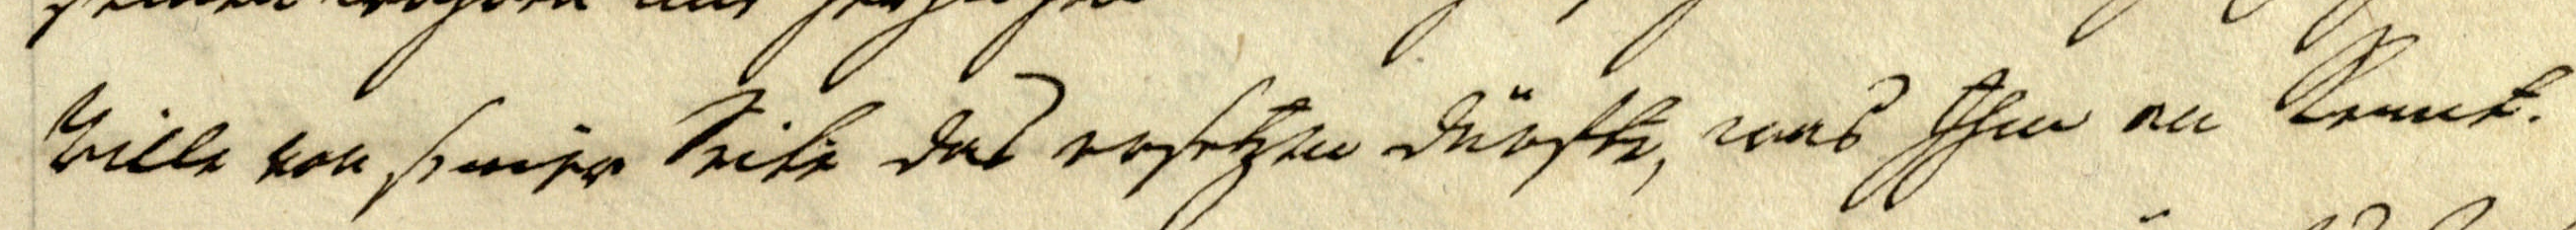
Wille von seiner Seite das ersetzen dürfte, was Ihm an Kennt¬
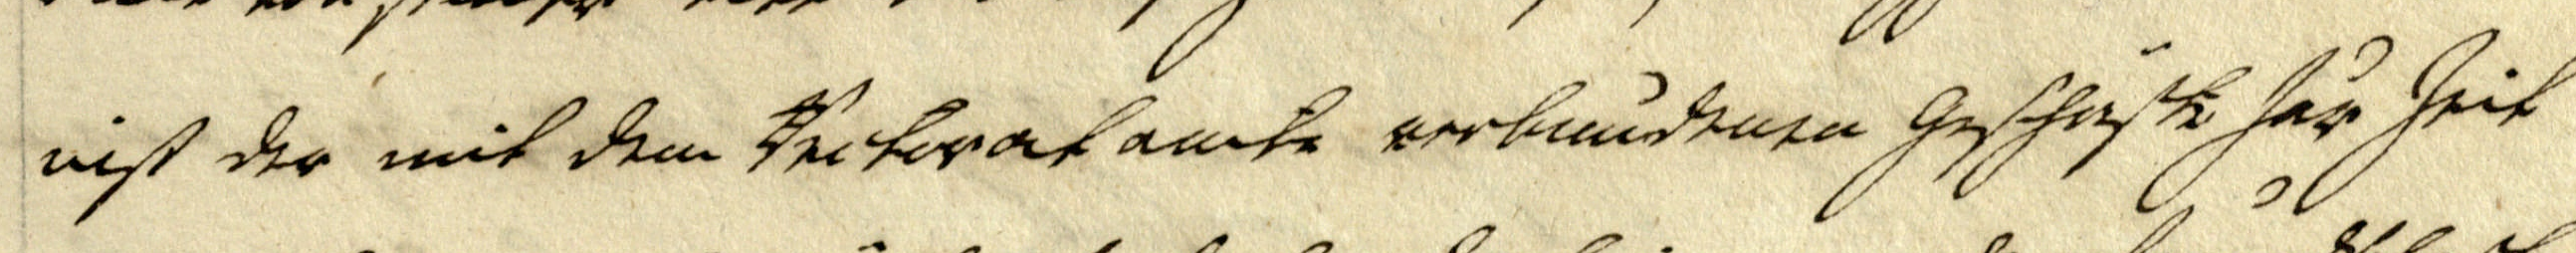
niß der mit dem Rectoratamte verbundenen Geschäfte zur Zeit
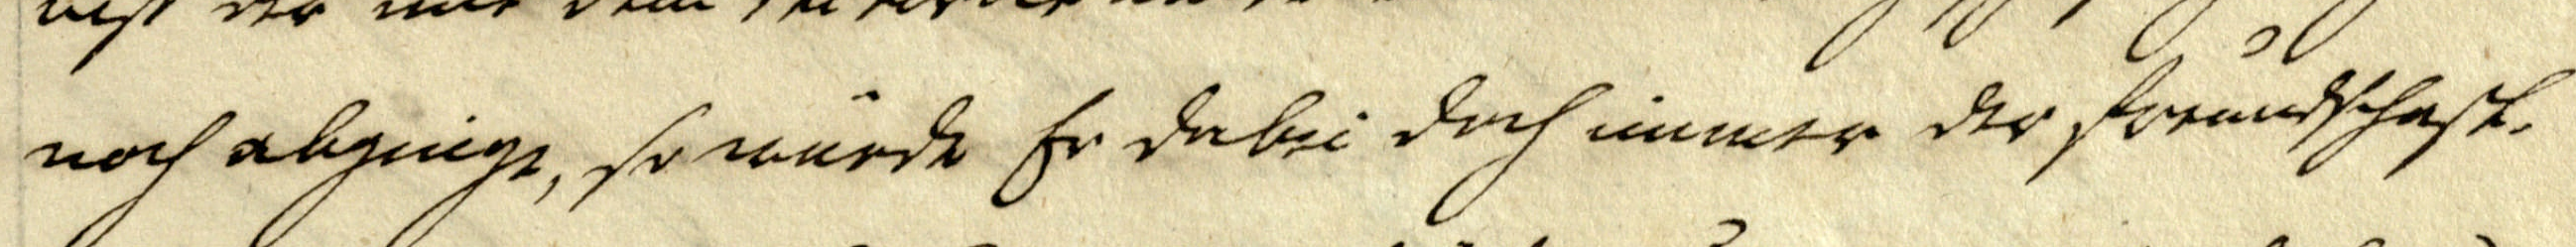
noch abginge, so würde Er dabei doch immer der freundschaft¬
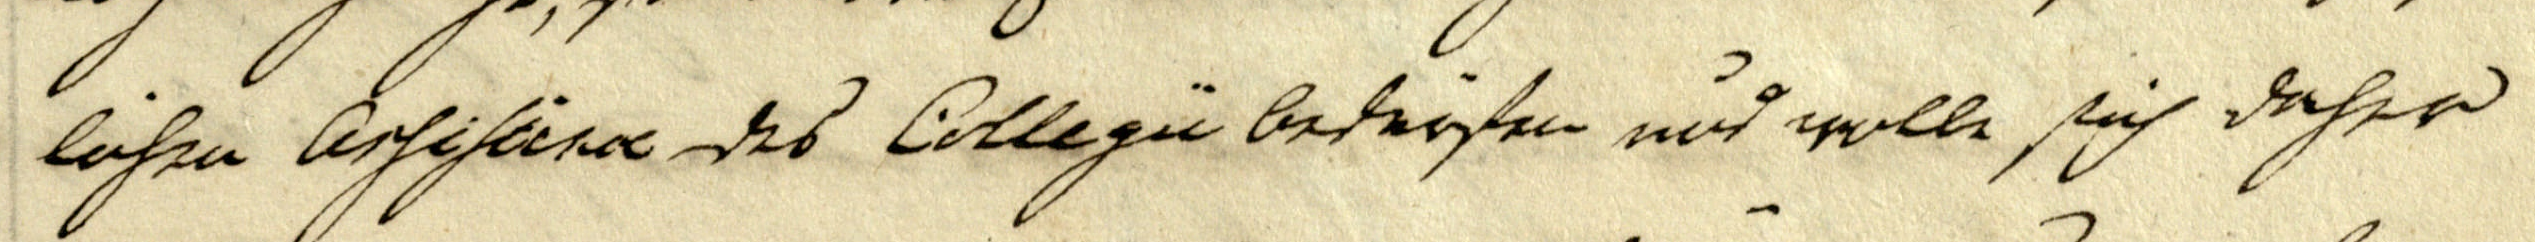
lichen Assistence des Colegii bedürfen und wolle sich daher
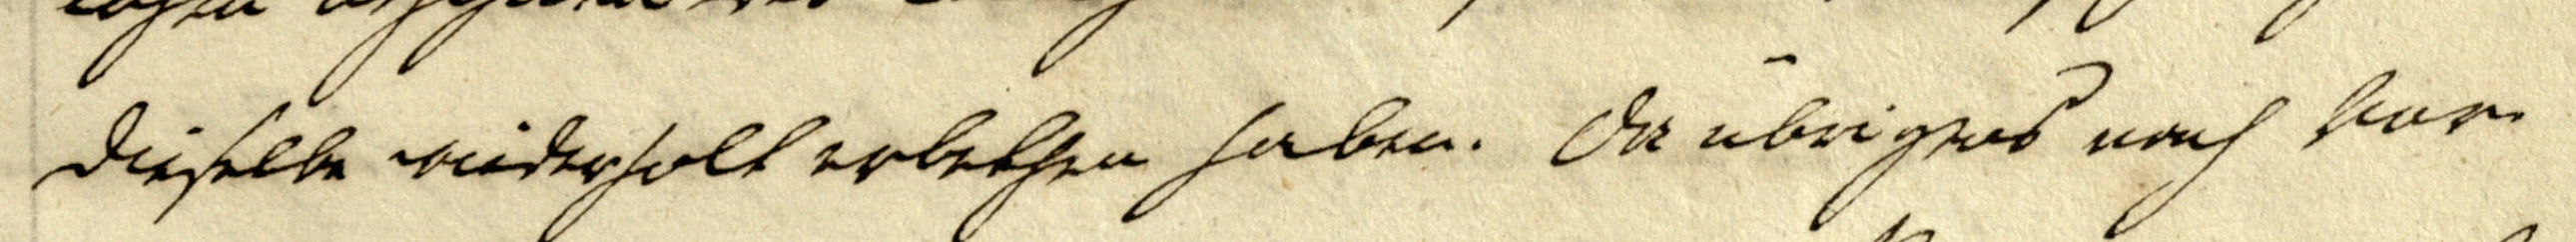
dieselbe wiederholt erbethen haben. Da übrigens nach Vor¬
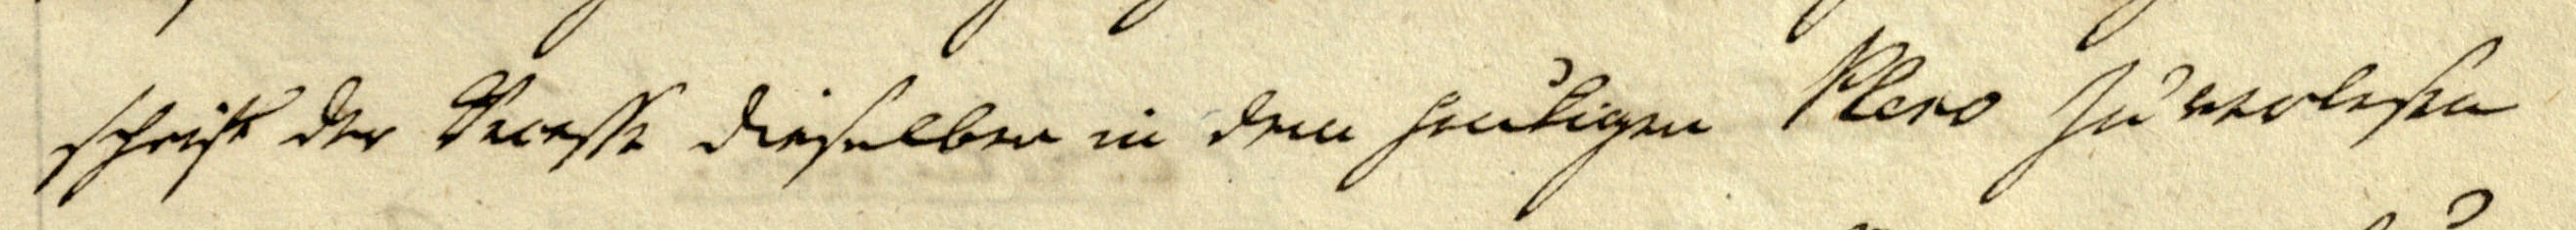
schrift der Recesse dieselben in dem heutigen Pleno zu verlesen
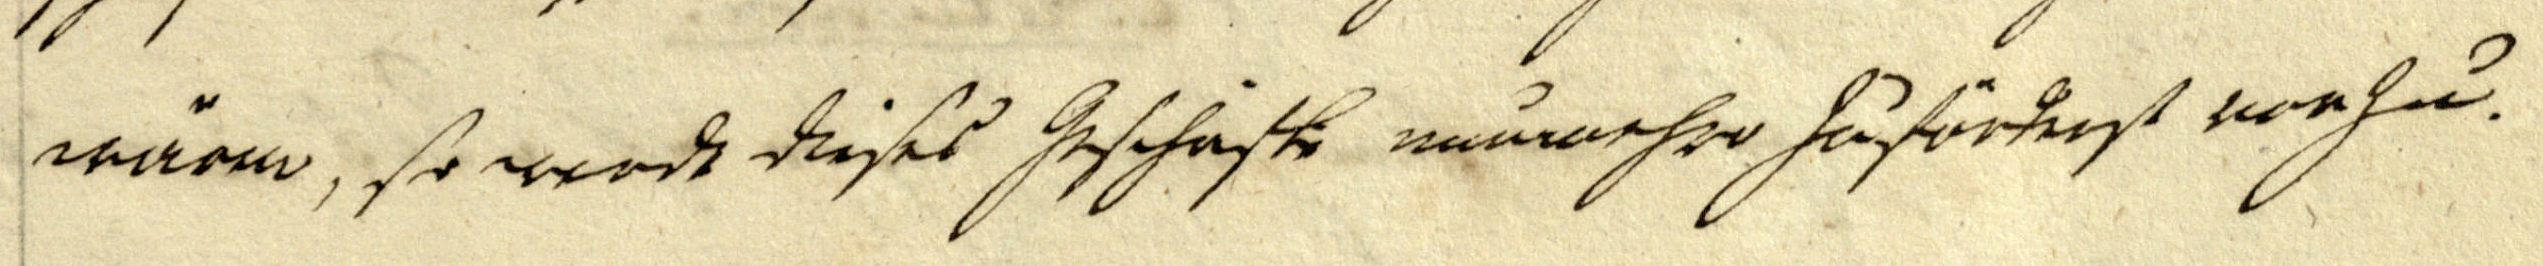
wären, so werde dieses Geschäfte nunmehro zuförderst vorzu¬
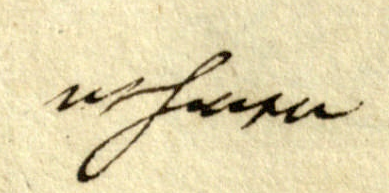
nehmen
